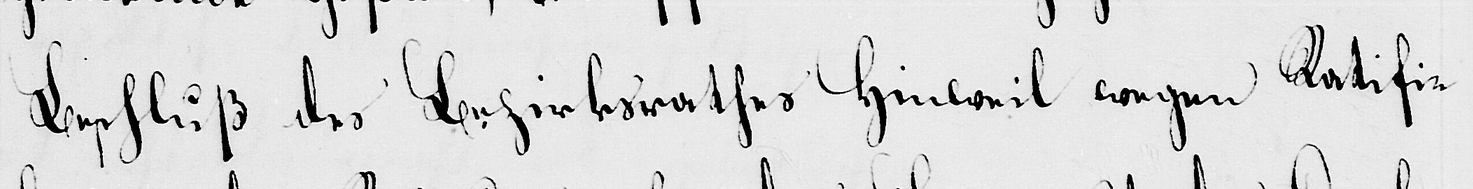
Beschluß des Bezirksrathes Hinweil wegen Ratifi¬
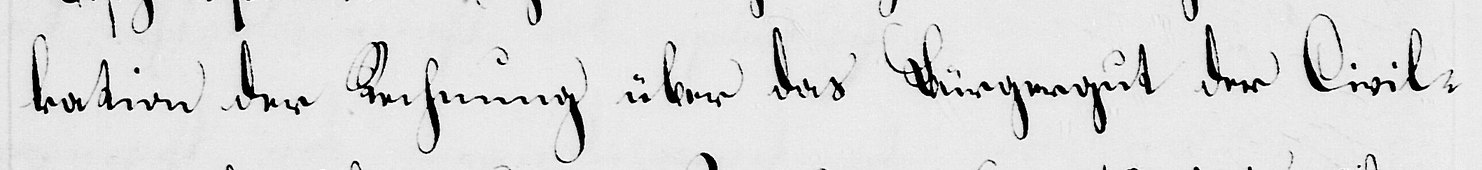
kation der Rechnung über das Bürgergut der Civil¬
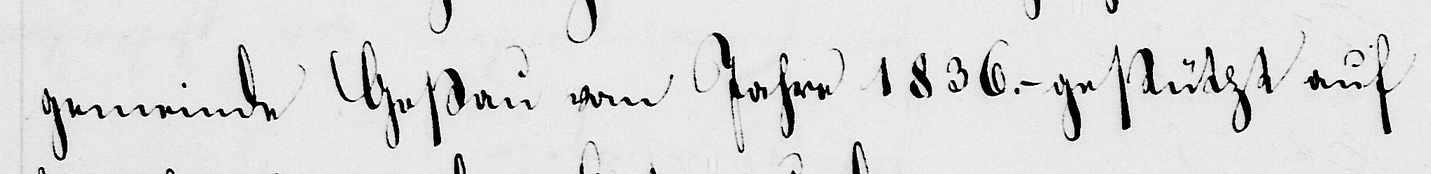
gemeinde Goßau vom Jahre 1836. – gestützt auf
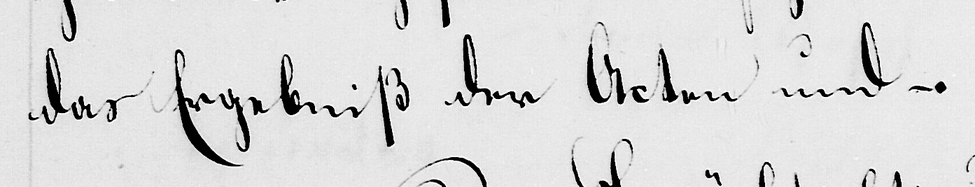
das Ergebniß der Acten und –
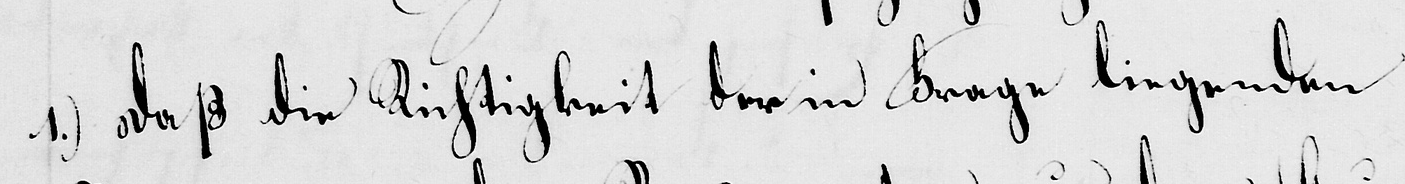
1.) Daß die Richtigkeit der in Frage liegenden
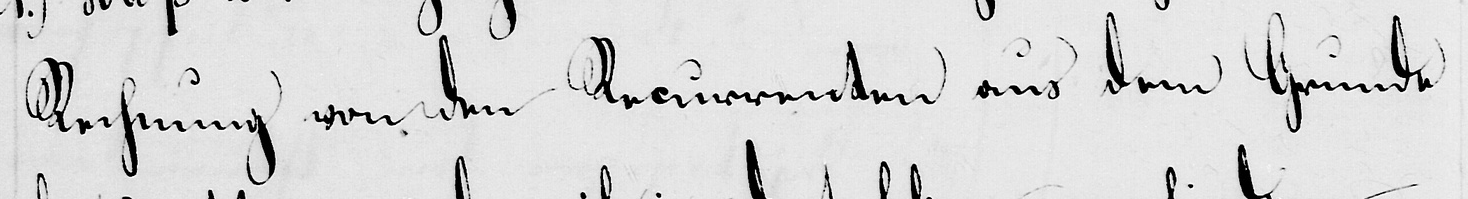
Rechnung von den Recurrenten aus dem Grunde
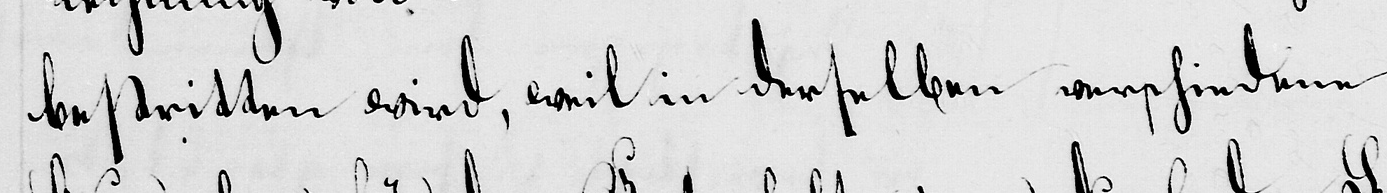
bestritten wird, weil in derselben verschiedene
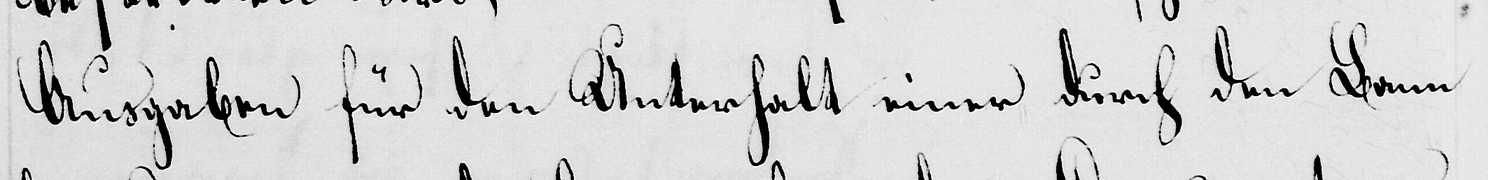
Ausgaben für den Unterhalt einer durch den Bann
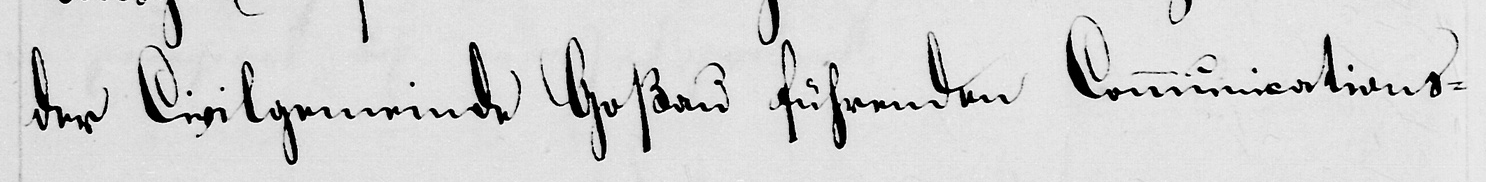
der Civilgemeinde Goßau führenden Communications-
